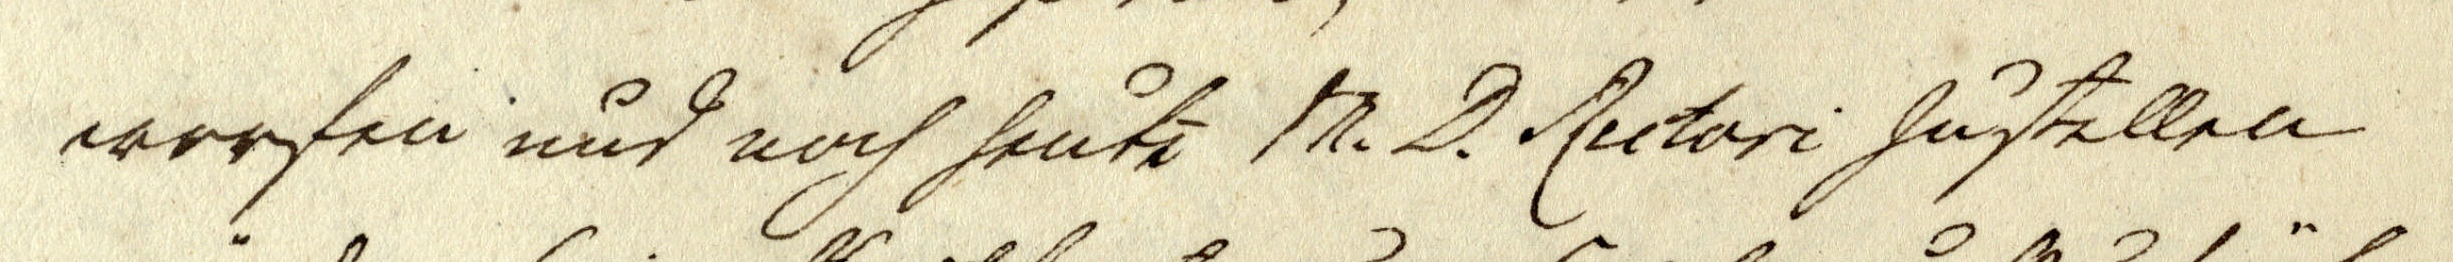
worfen und noch heute M. D. Rectori zustellen
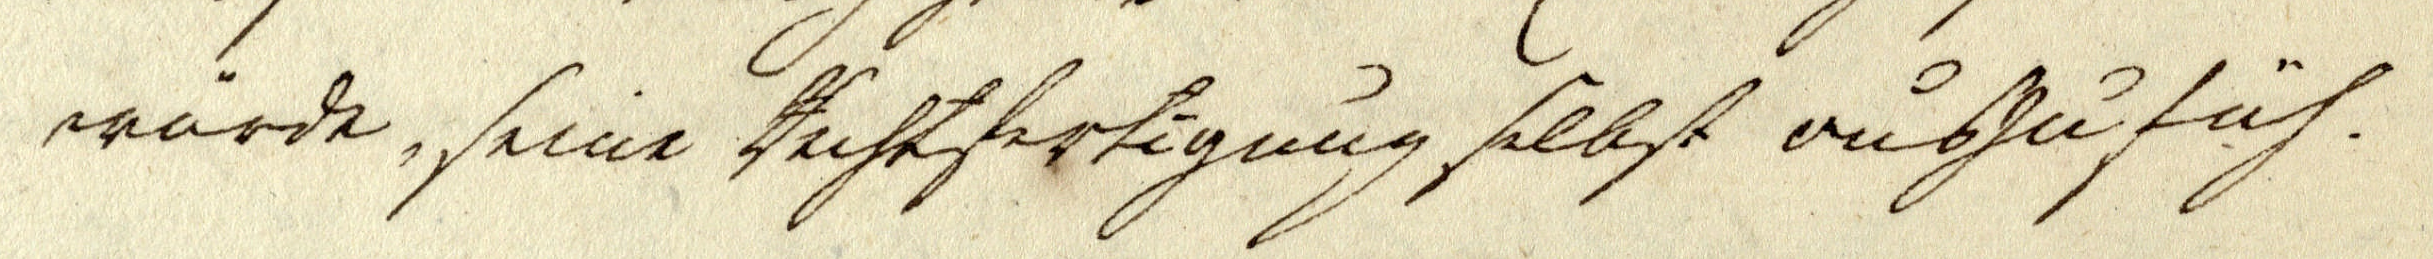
würde, seine Rechtfertigung selbst auszufüh¬
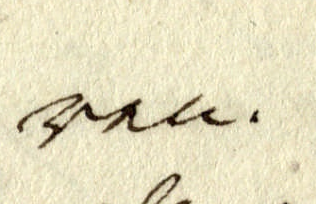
ren.
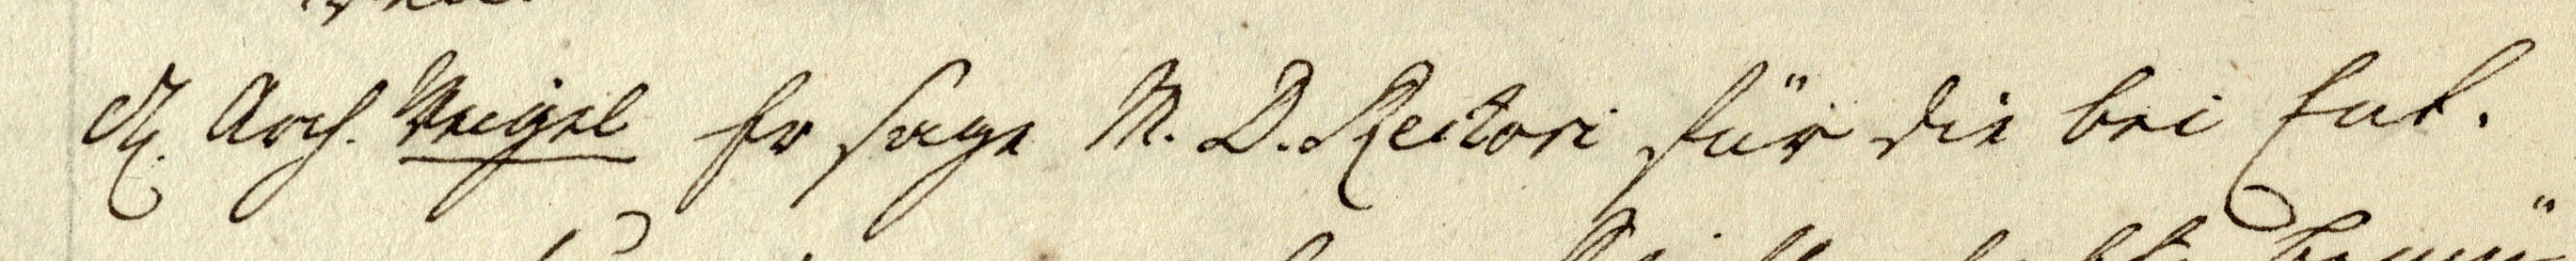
dh. Arch. Weigel. Er sage M. D. Rectori für die bei Ent¬
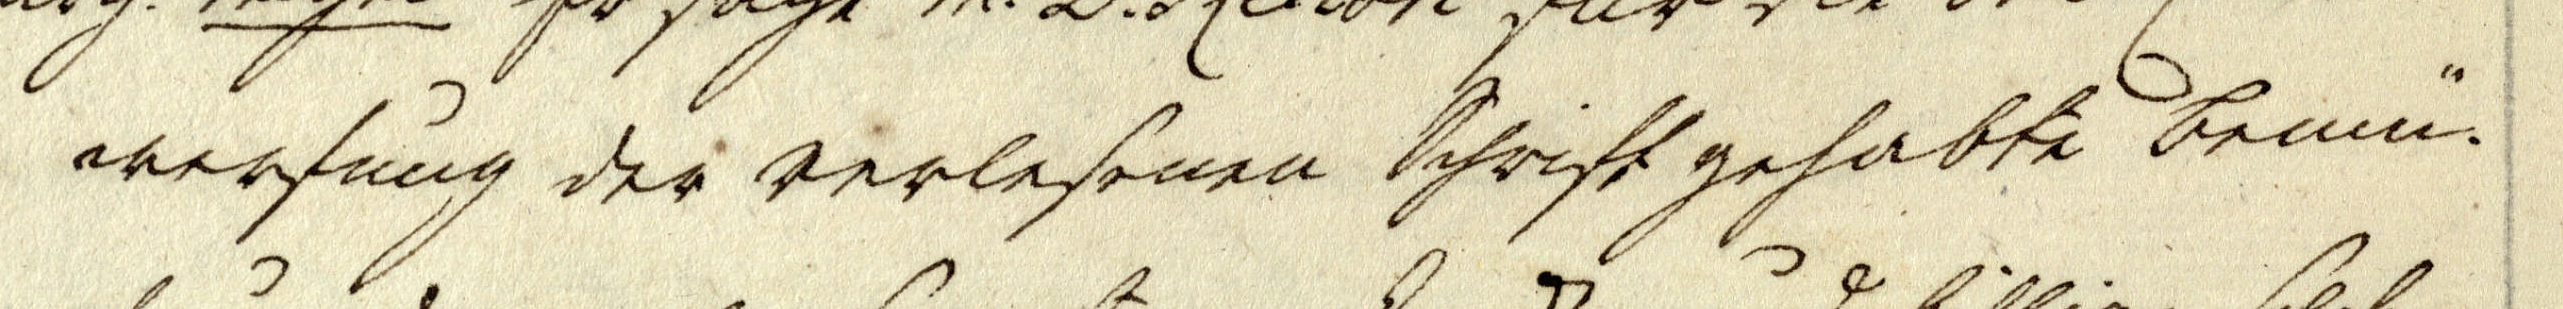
werfung der verlesenen Schrift gehabte Bemü¬
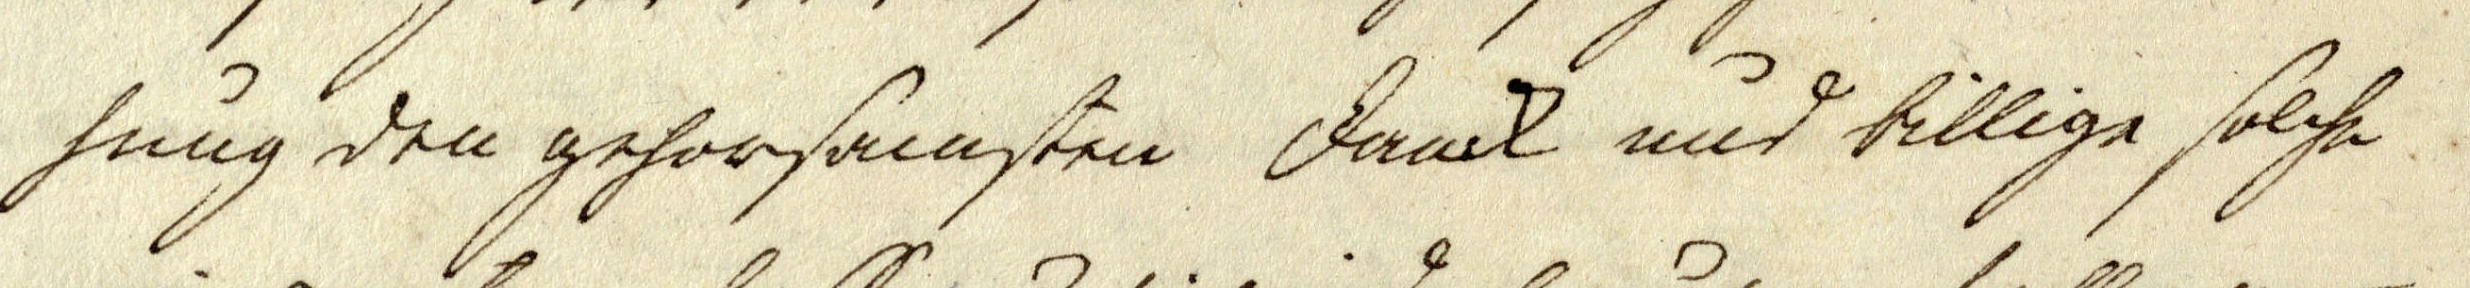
hung den gehorsamsten Danck und billige solche
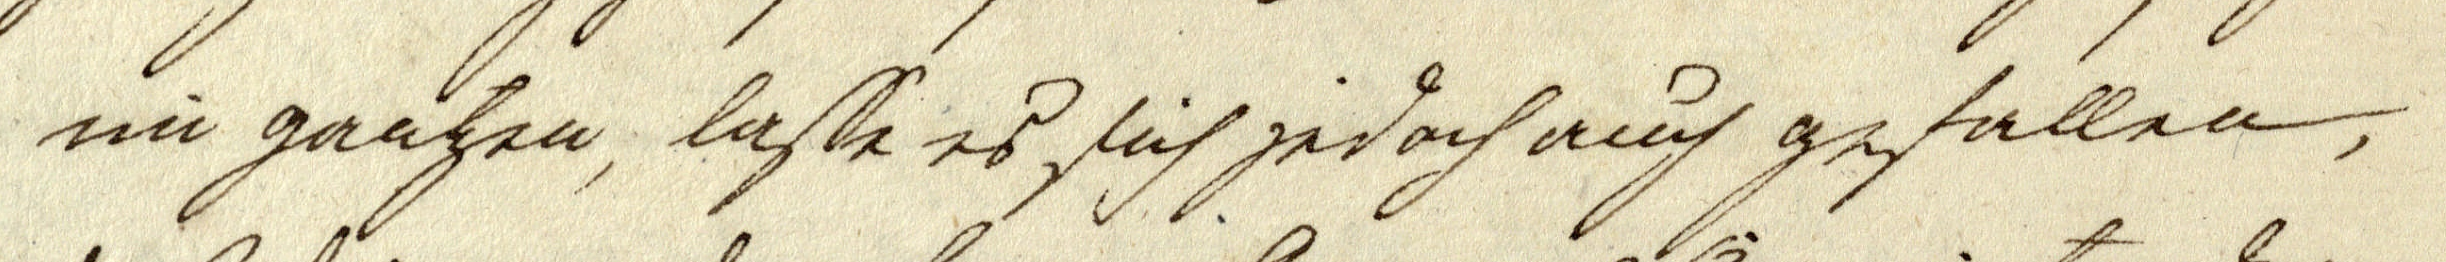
im gantzen, lasse es sich jedoch auch gefallen,
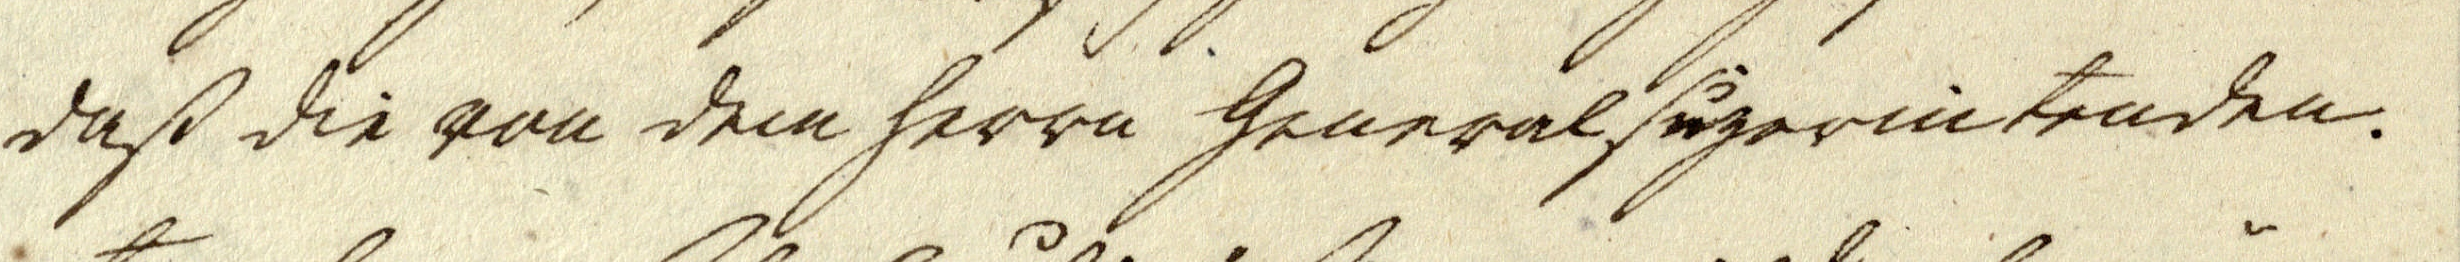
daß die von dem Herrn Generalsuperintenden
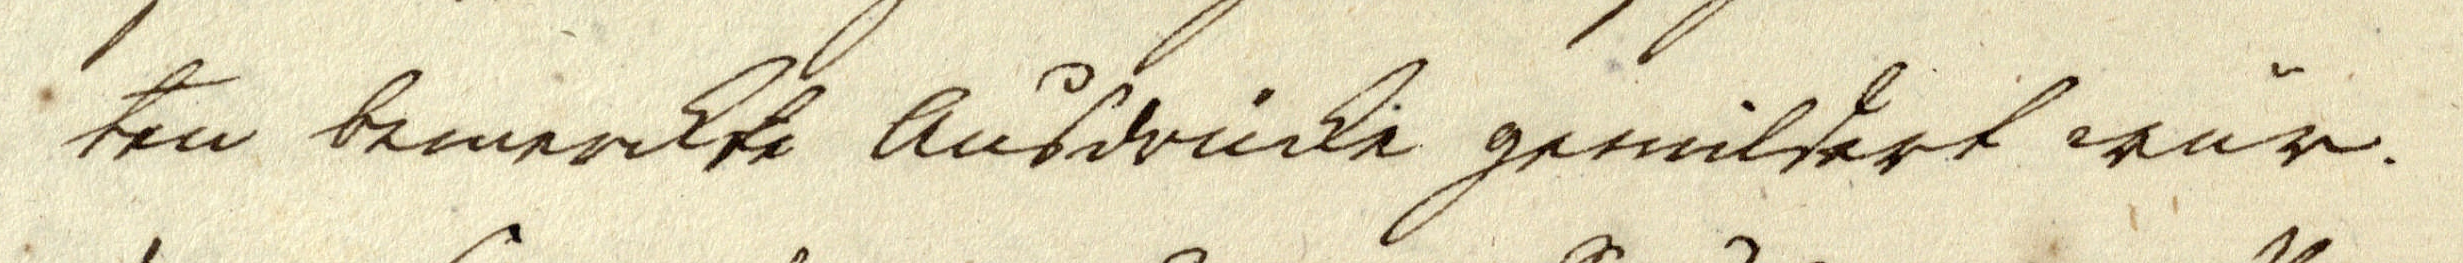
ten bemerckte Ausdrücke gemildert wür¬
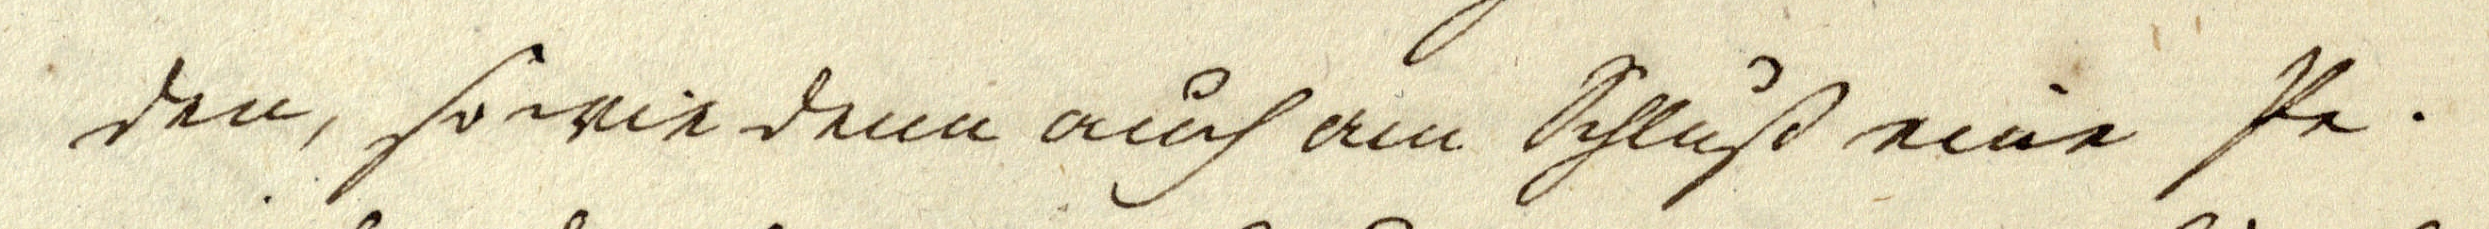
den, so wie denn auch am Schluß eine Pe¬
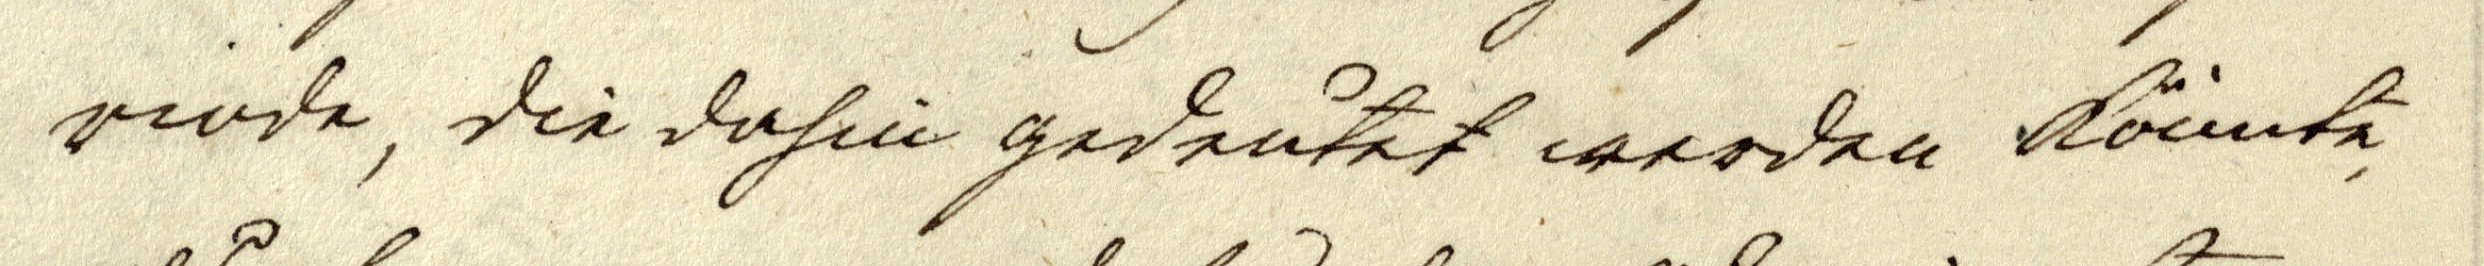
riode die dahin gedeutet werden könnte,
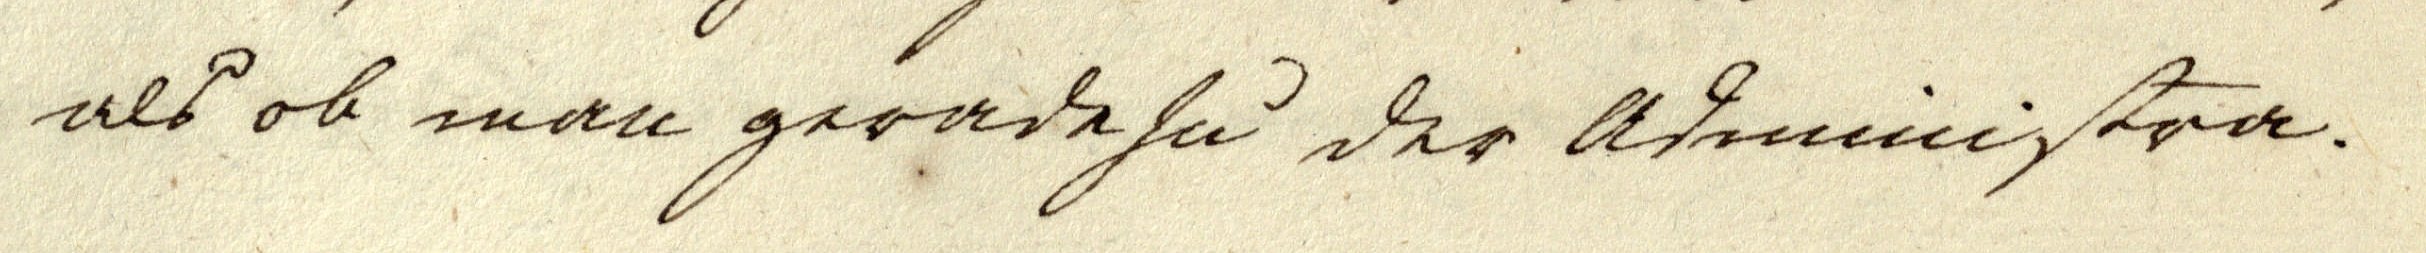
als ob man geradezu der Administra¬
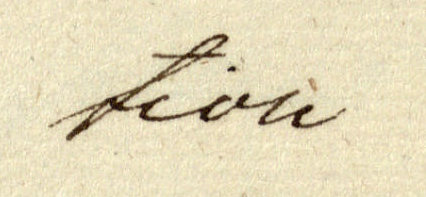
tion
